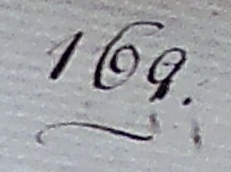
169.
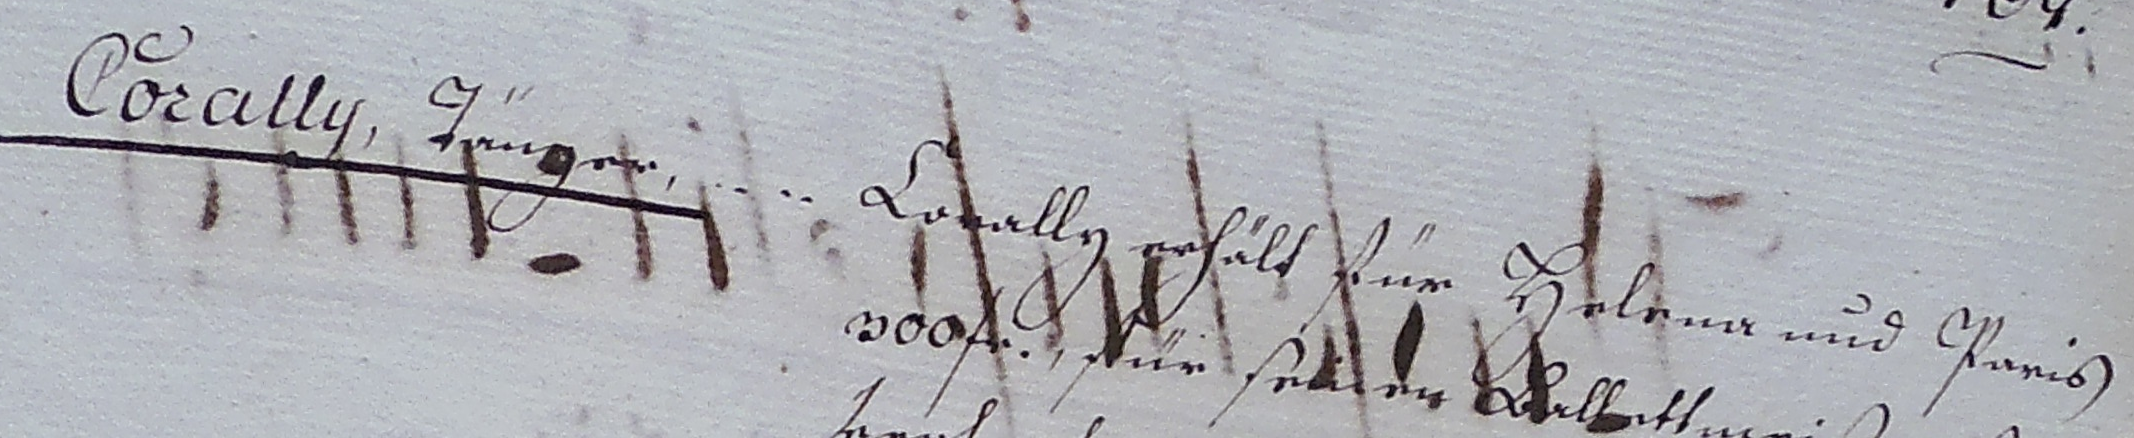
Corally, Tänzer, .. .. Corally erhält für Helena und Paris
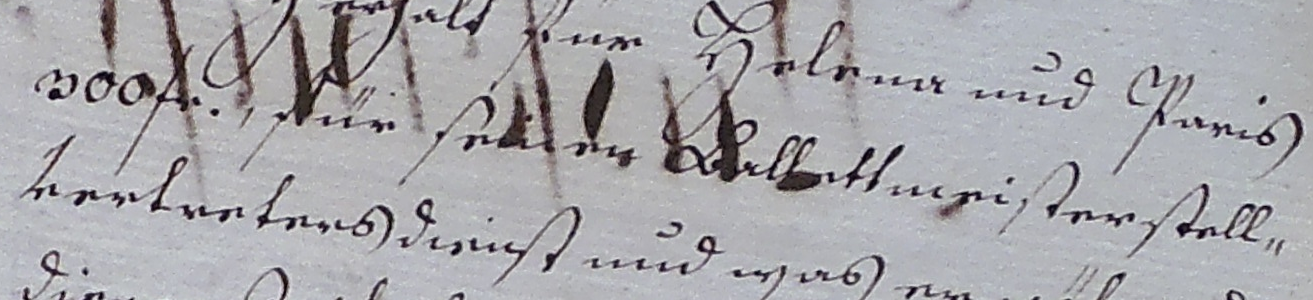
300fr., für seinen Ballettmeisterstell¬
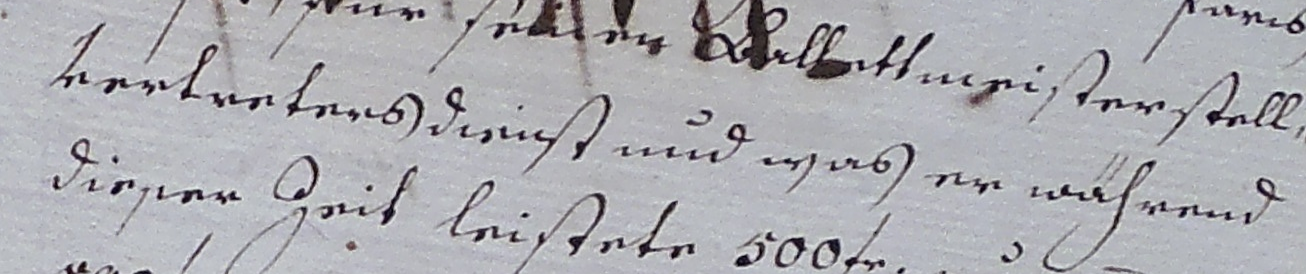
vertretersdienst und was er während
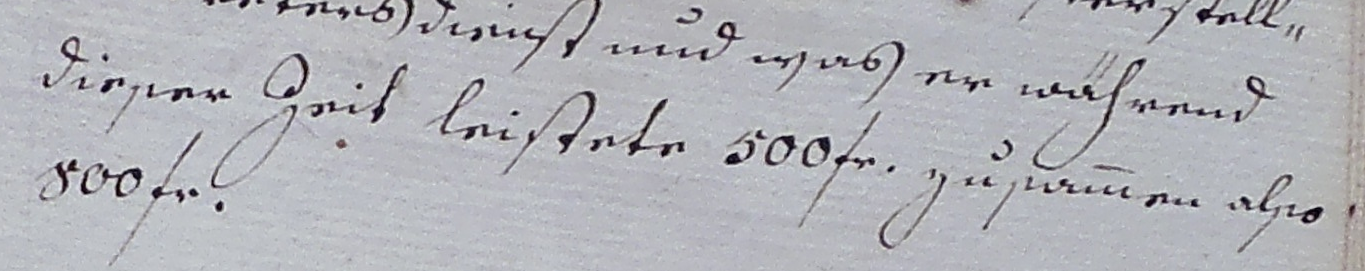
dieser Zeit leistete 500fr. zusam̅en also
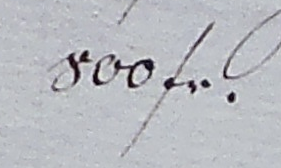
800fr.
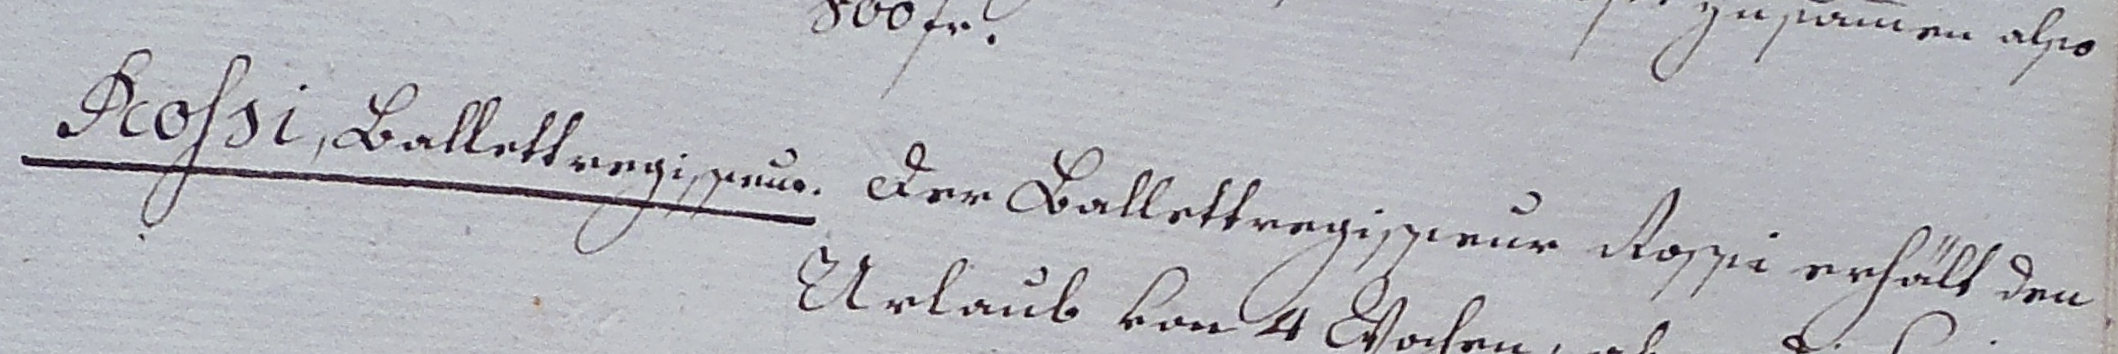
Rossi, Ballettregisseur. Der Ballettregisseur Rossi erhält den
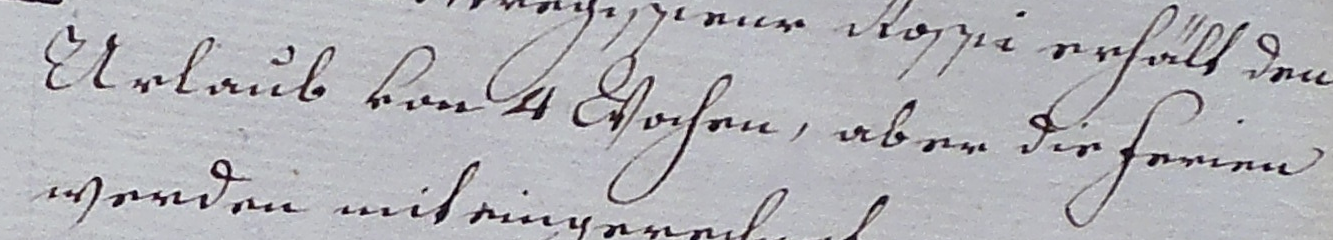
Urlaub von 4 Wochen, aber die Ferien
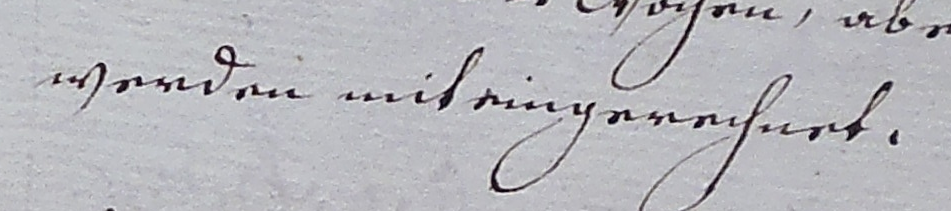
werden miteingerechnet.
